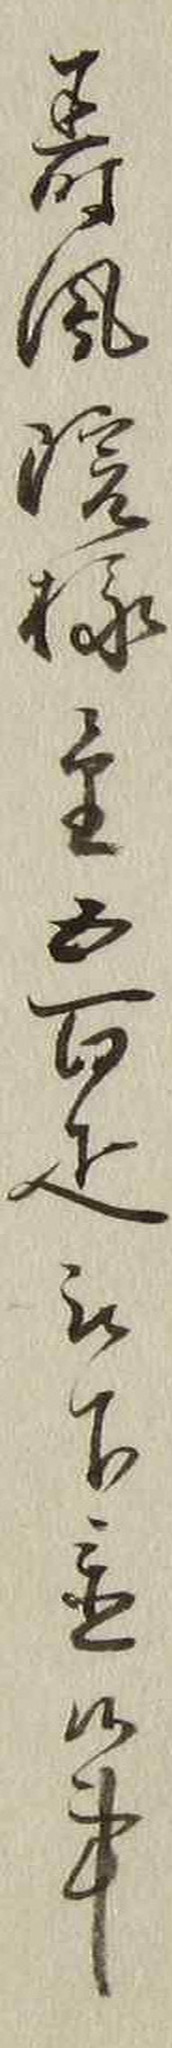寿鳳院様金五百疋被下置候事
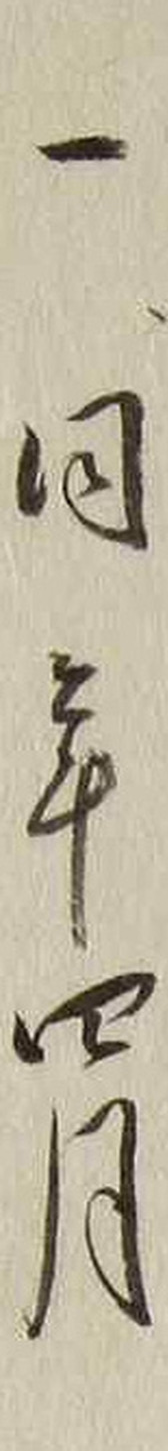一同年四月
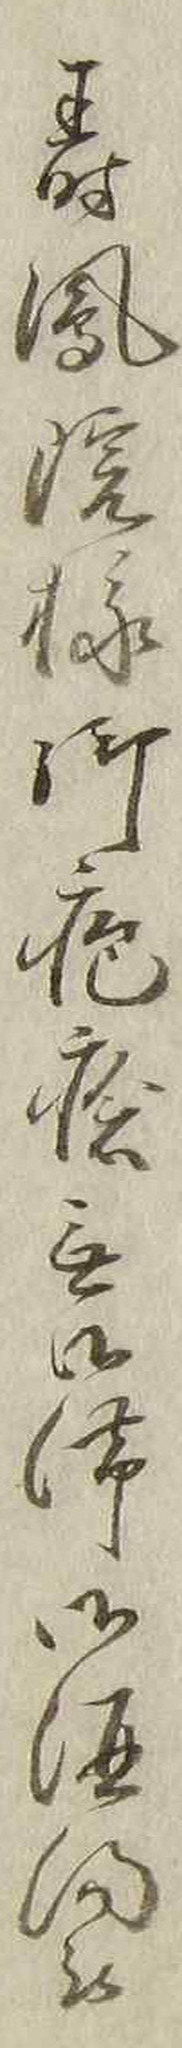寿鳳院様御疱瘡無御滞御酒湯被
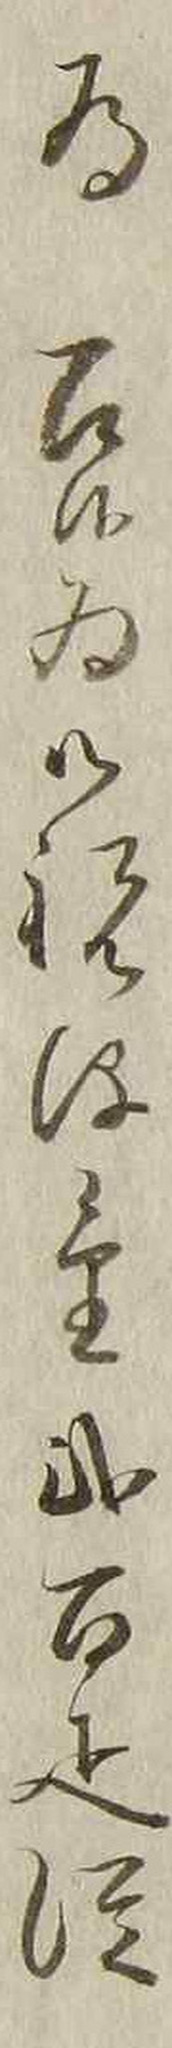為召候為御祝儀金弐百疋従

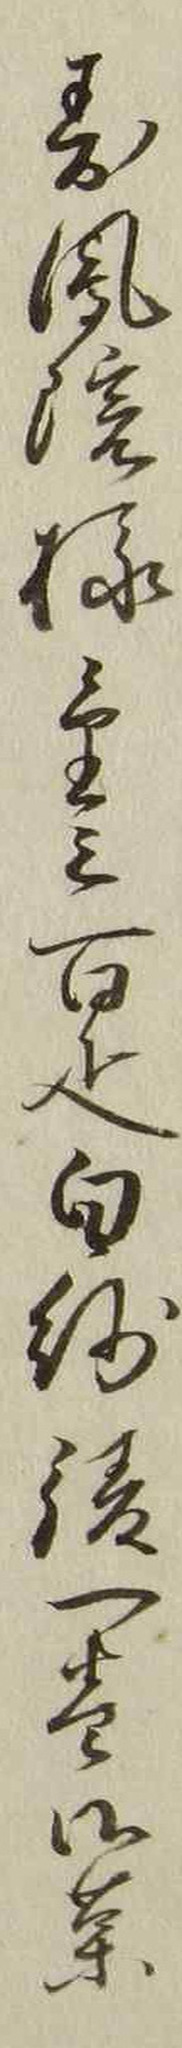寿鳳院様金三百疋白紗綾一巻御菓
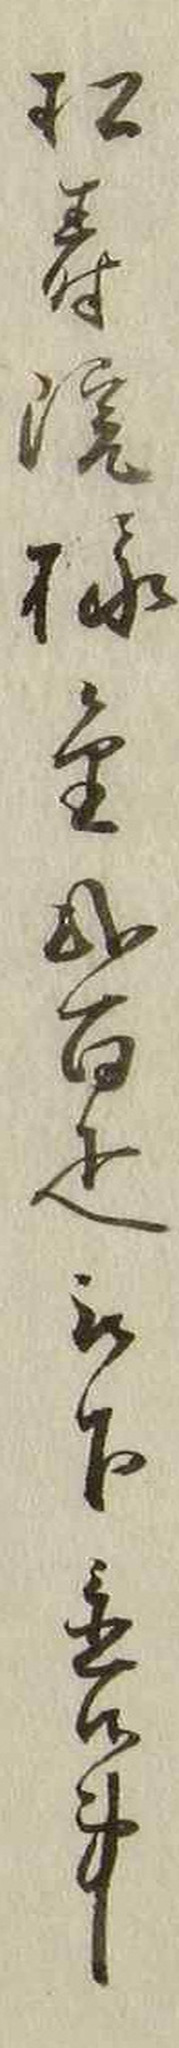松寿院様金弐百疋被下置候事
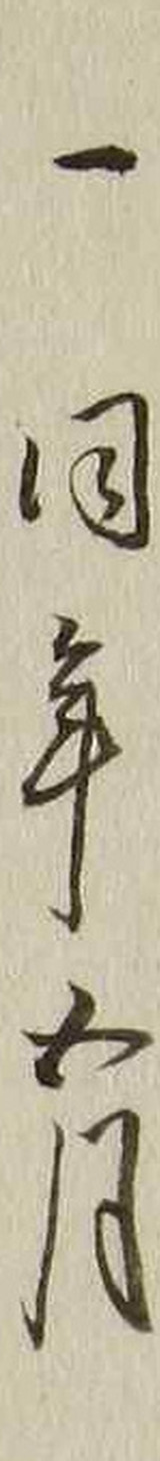一同年五月
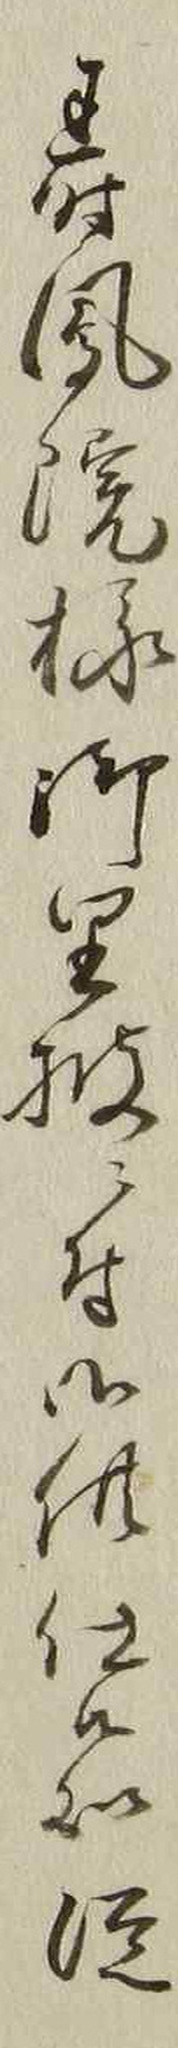寿鳳院様御里披ニ付御供仕候処従
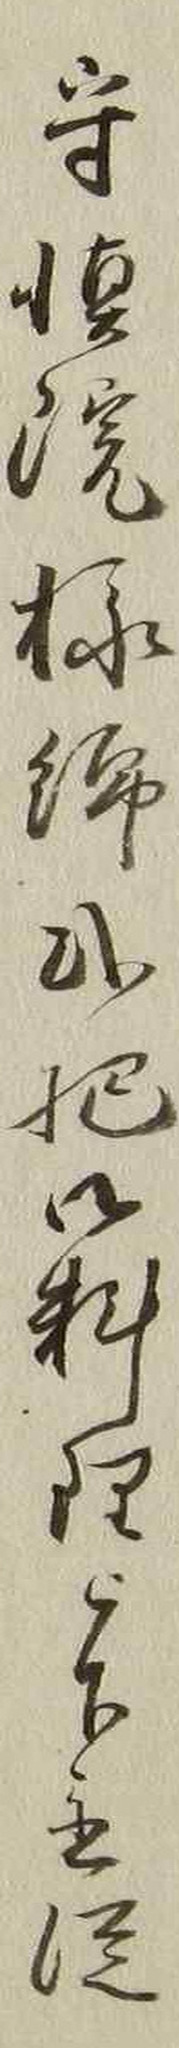守慎院様綿弐把御料理被下置従
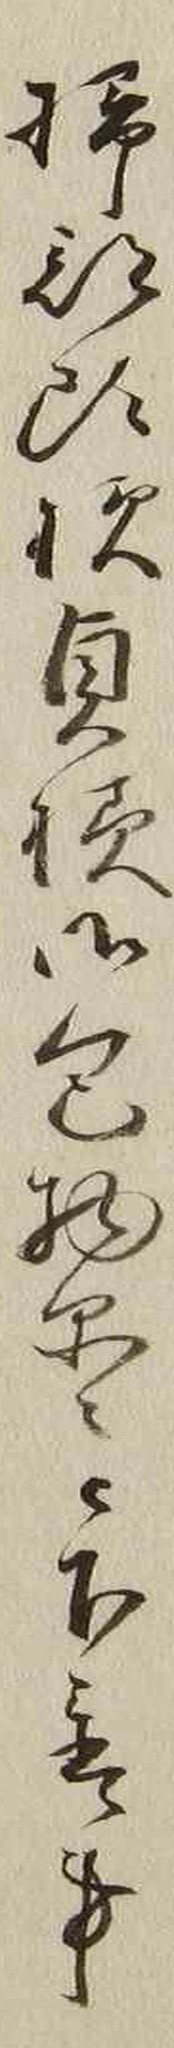掃部頭様貞様御包物品々被下置候事
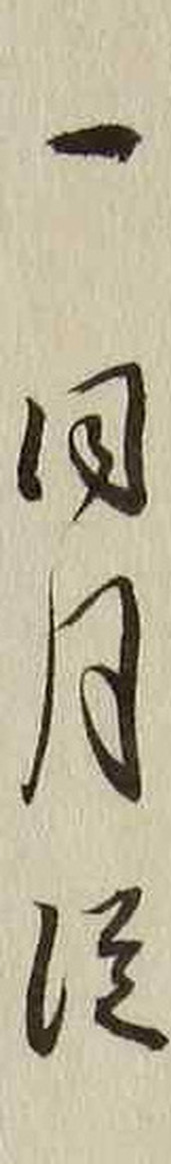一同月従
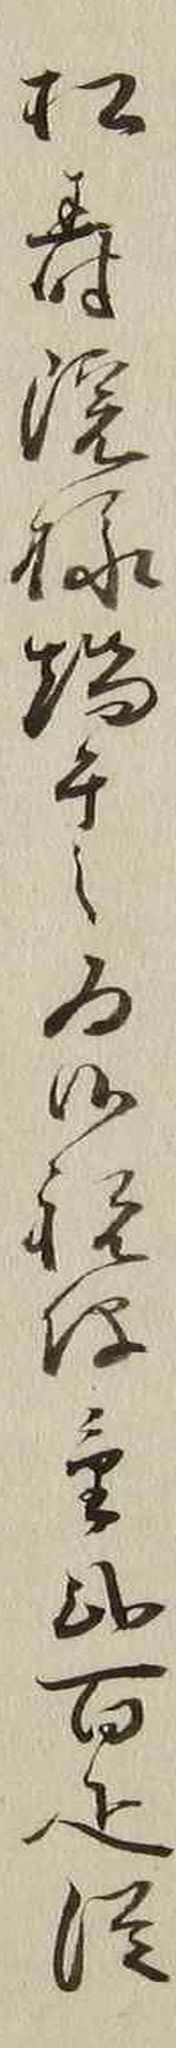松寿院様端午之為御祝儀金弐百疋従
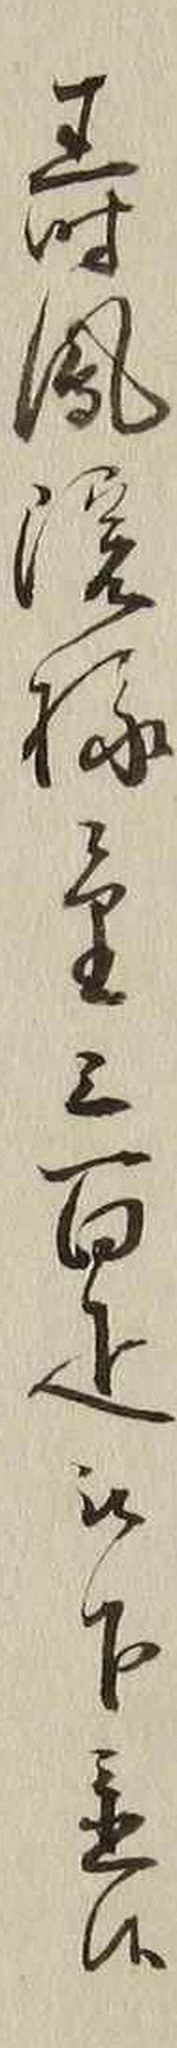寿鳳院様金三百疋被下置候
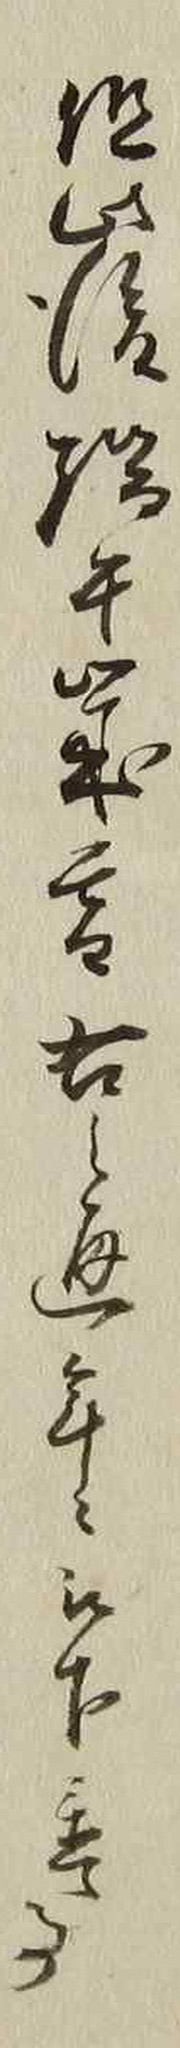但此後端午歳暮右之通年々被下置候事
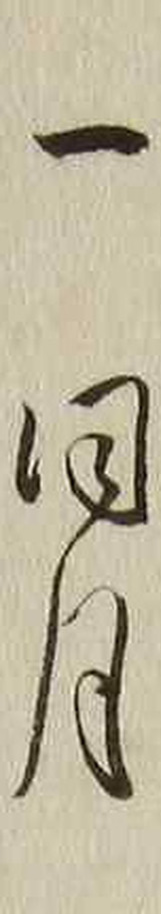一同月
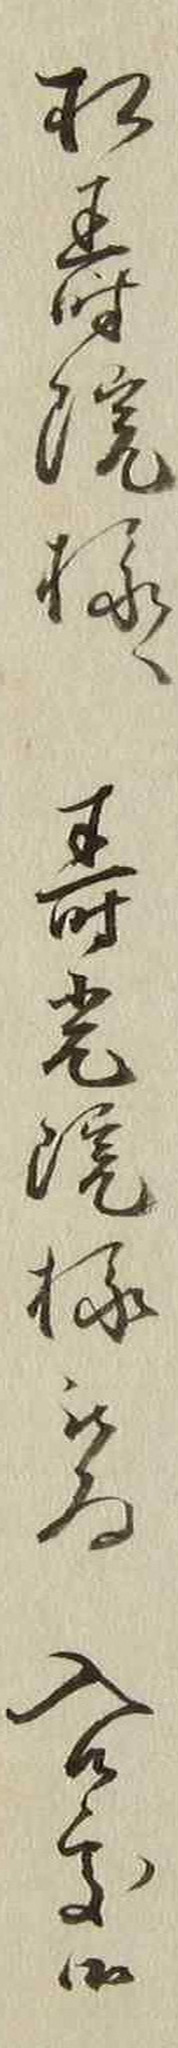松寿院様へ寿光院様被為入候処御
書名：諸士系譜　巻之28　い之部28
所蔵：会津若松市立会津図書館
